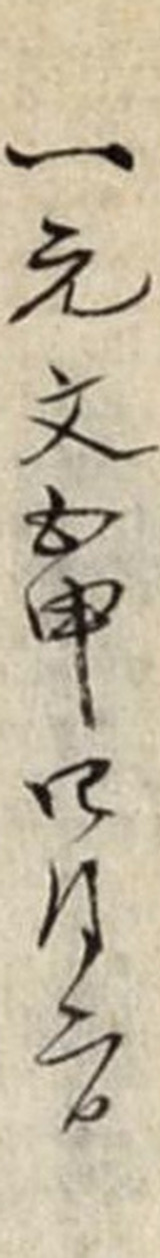一元文五申四月二日
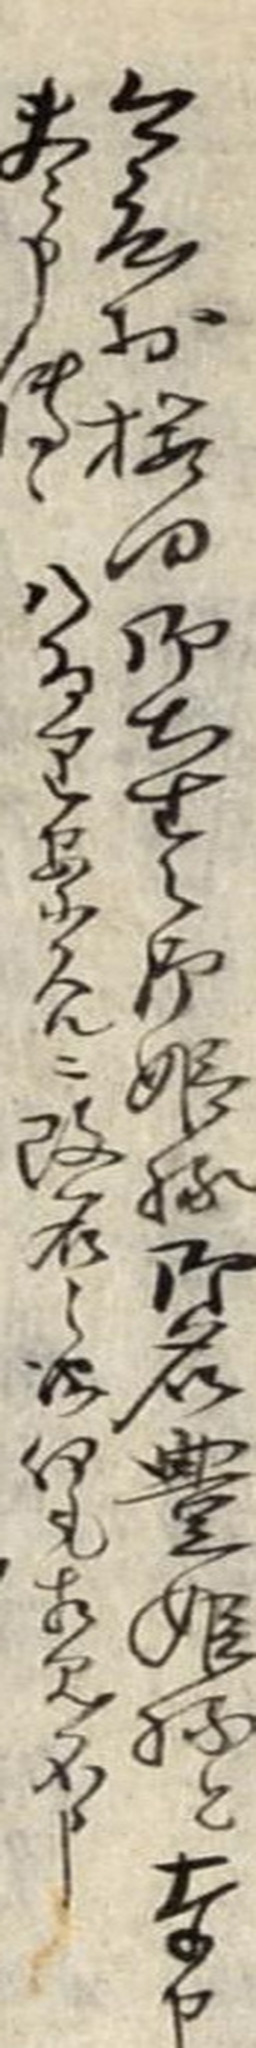夫々申伝候八百里案するに改名之儀何も相見不申
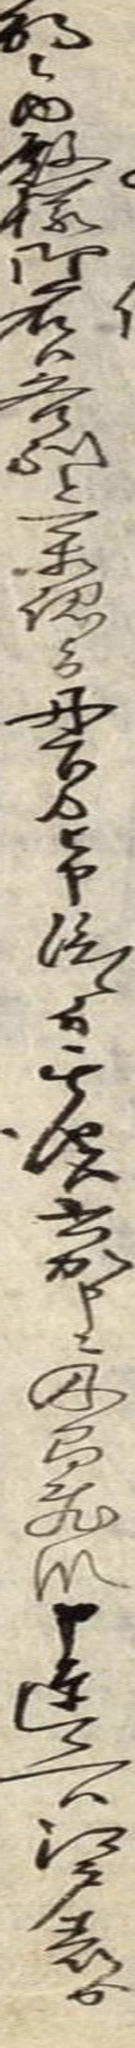△右御触之内殿様御名は各別と可相認旨丹下方被申渡候に付其儀は書加申に及間敷段申達候へは江戸表ゟ
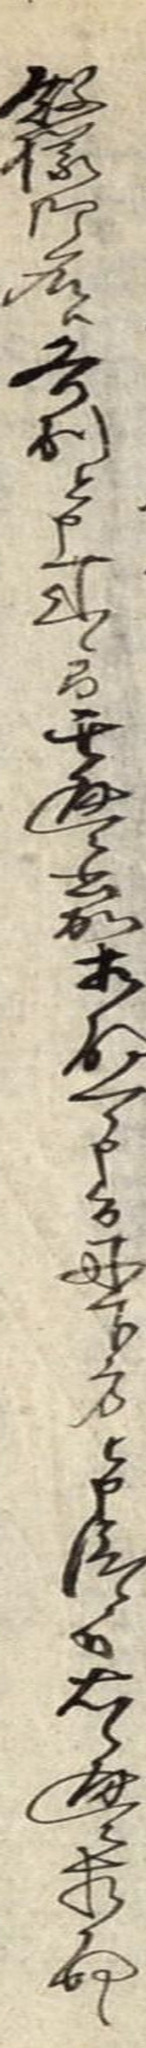殿様御名は各別と申来候間其通書加相触可申旨丹下方被申渡候付右之通相触候
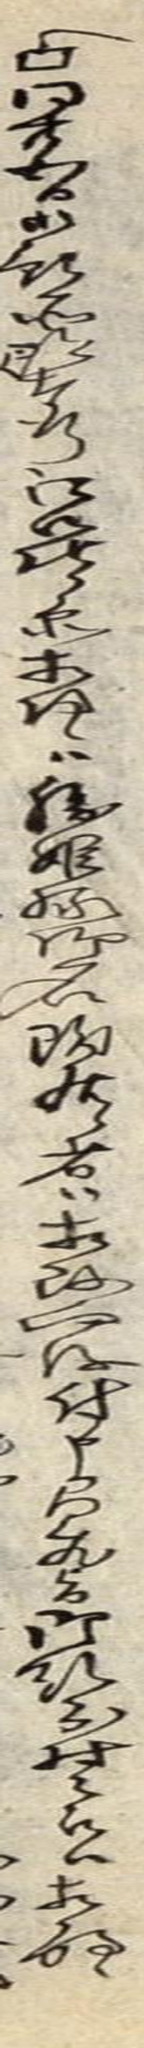同廿五日御預所郡奉行江口次郎兵衛相伺候は勝姫様御名附居候者は相改向後付申間敷旨御御領分村々江は相触候
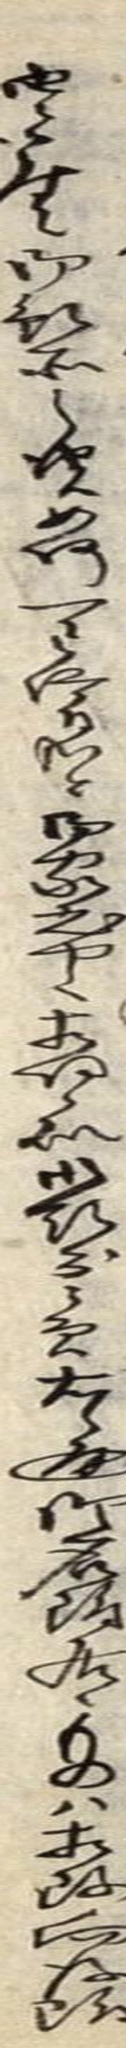由に御座候御預所之儀は如何可被仰付哉と御家老中へ相伺候処御領分に而は右之通御名附居候ものは相改向後附
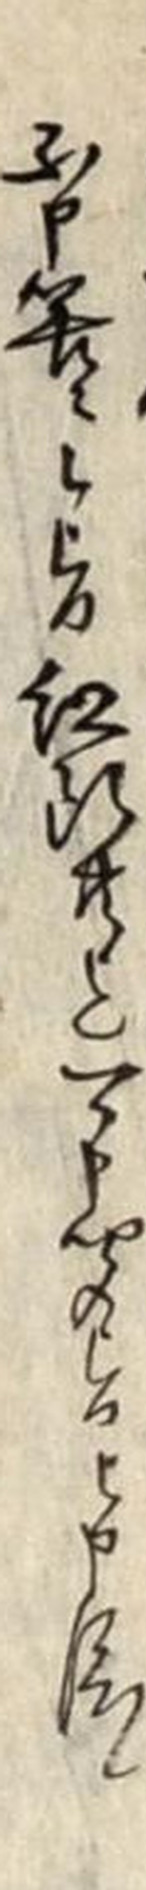不申筈に候旨組頭共迄可申聞旨被申渡候
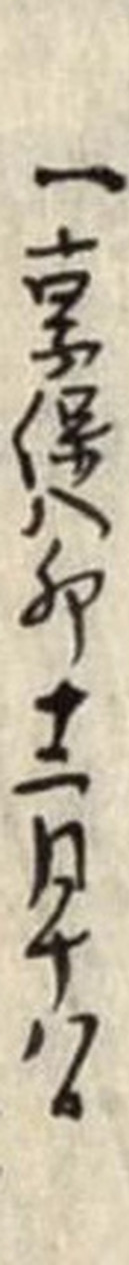一享保八卯十二月十八日
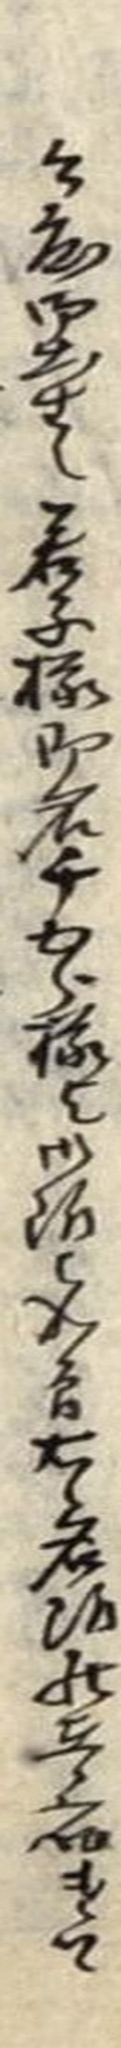今度御出生之養子様御名千五郎様と御附被成候間右之名附罷在候者も候はゝ
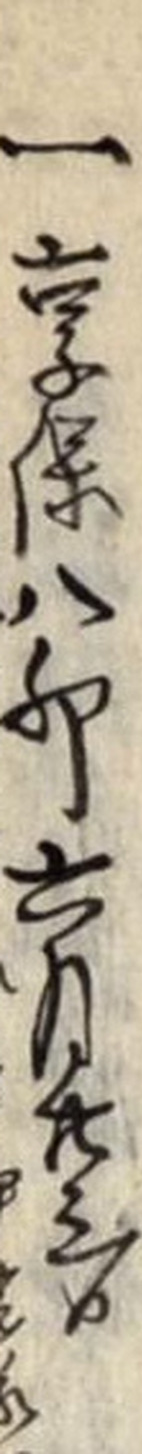一享保八卯六月廿三日
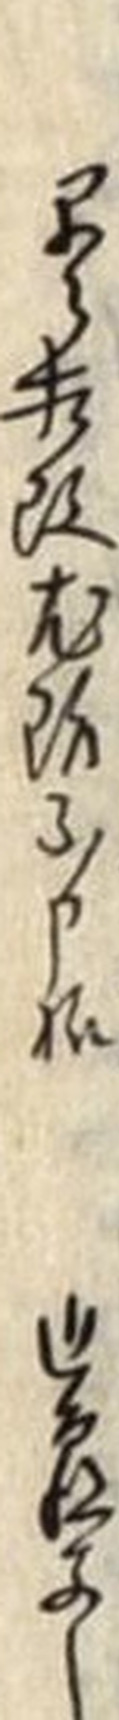早々相改尤附不申様追而組支ー
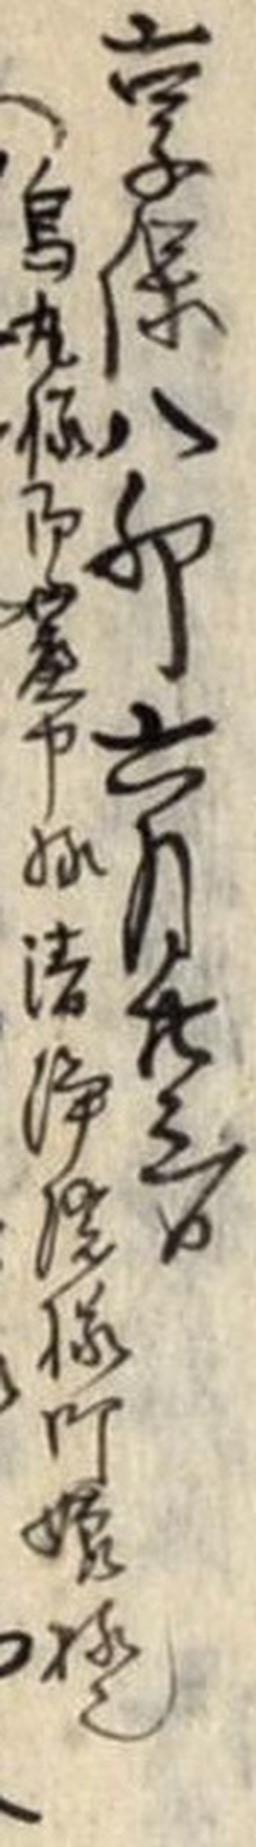烏丸様御簾中様清浄院様御姫様也
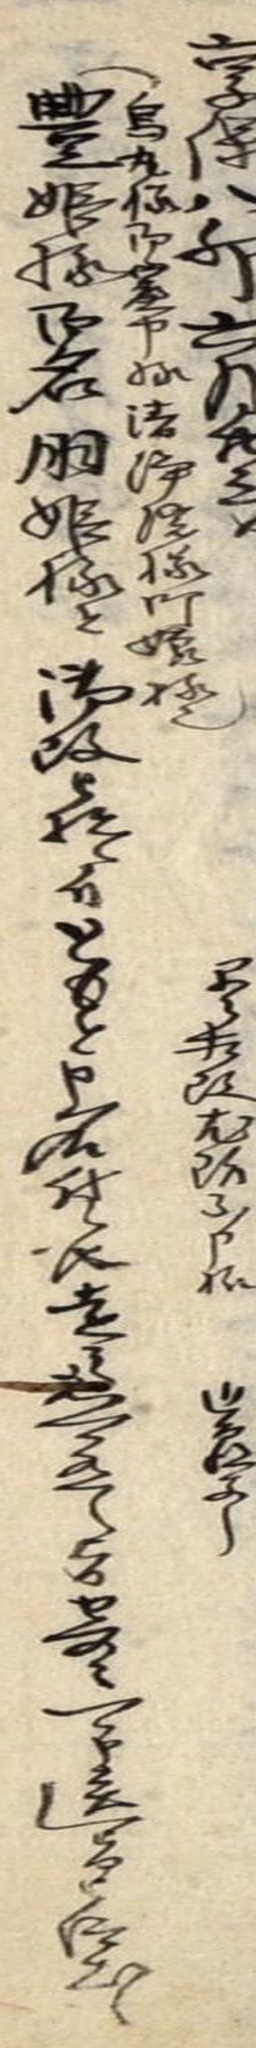豊姫御名朋姫様と御改被遊候に付ともと申名付候儀遠慮可有之旨寄々可申達旨被仰出候

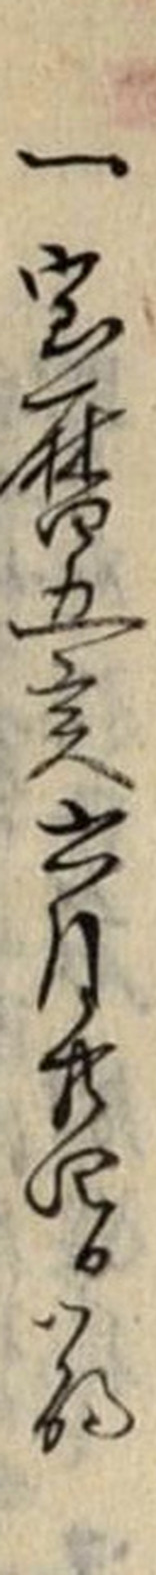一宝暦五亥六月廿四日御触
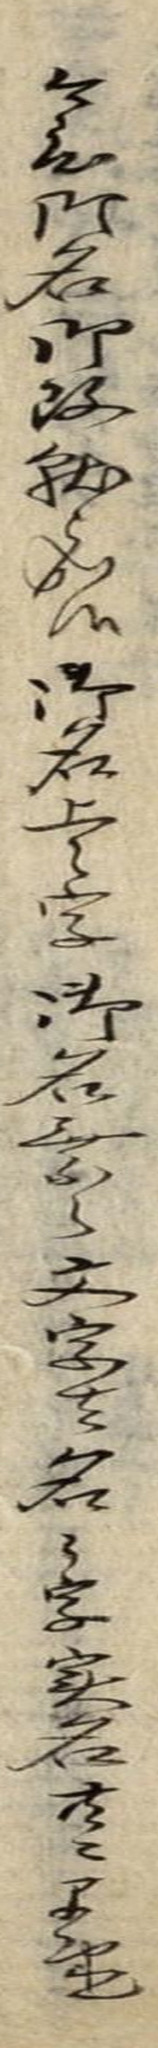今度御名御改就被成候御名上之字御名乗之文字は名之字実名共に早速
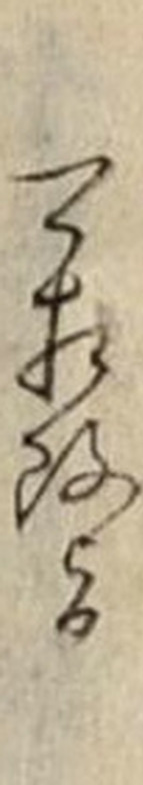可相改旨
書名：蒐輯之部
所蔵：福井県文書館 Fukui Prefectural Archives
